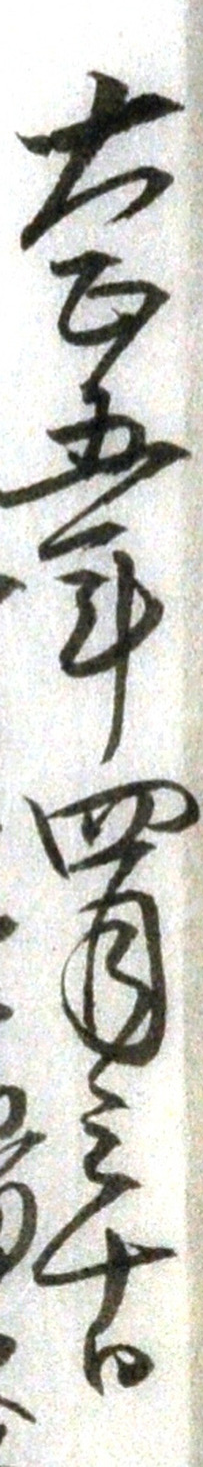大正五年四月三十日
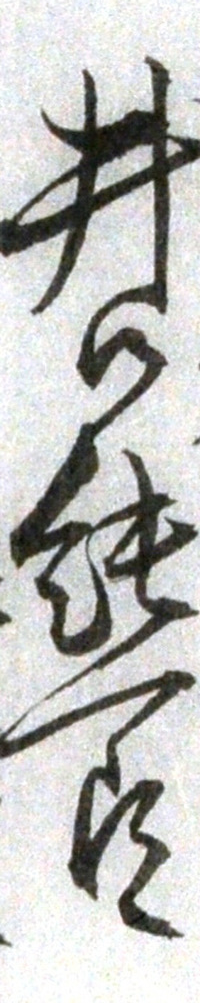井口純一郎
